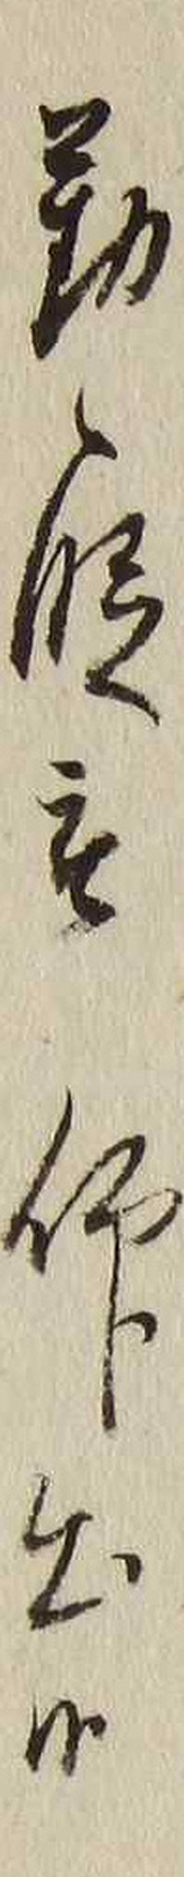勤候段被仰出候
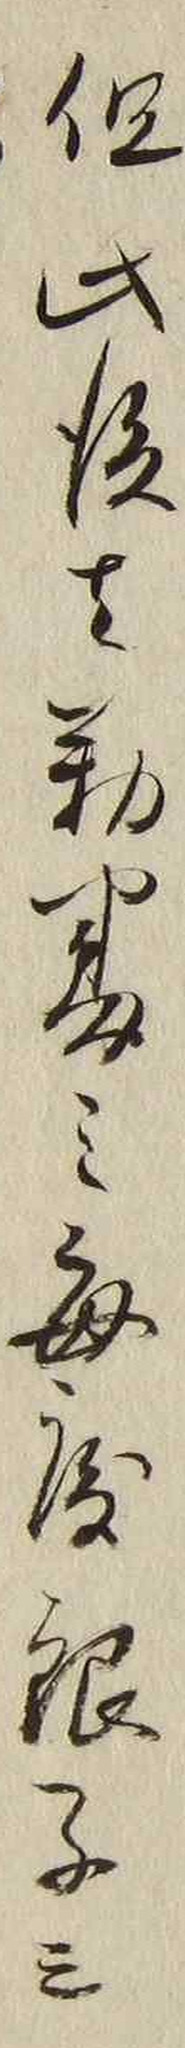但此後者勤番之毎度銀子三
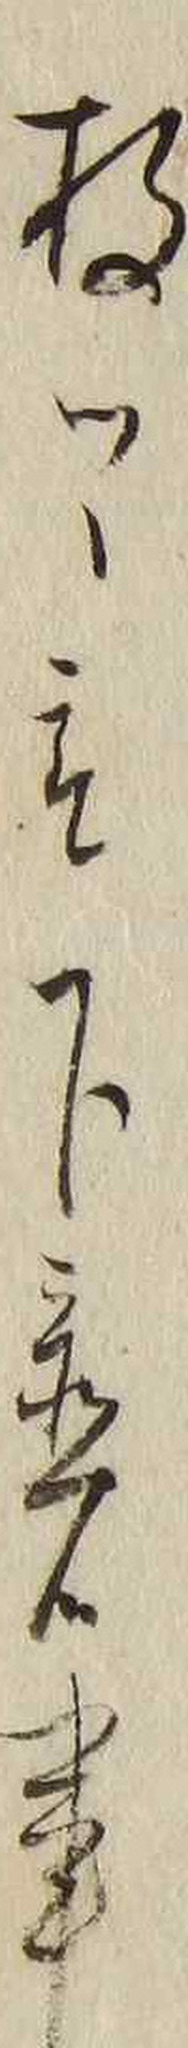枚ツヽ被下置候事

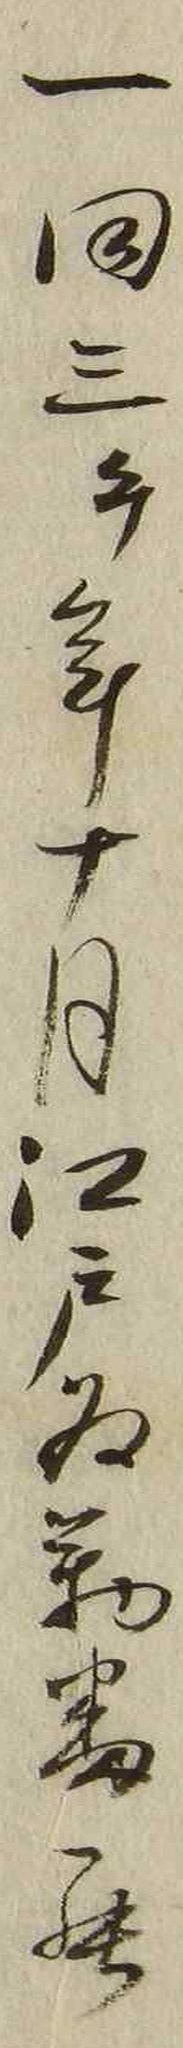一同三午年十月江戸為勤番罷
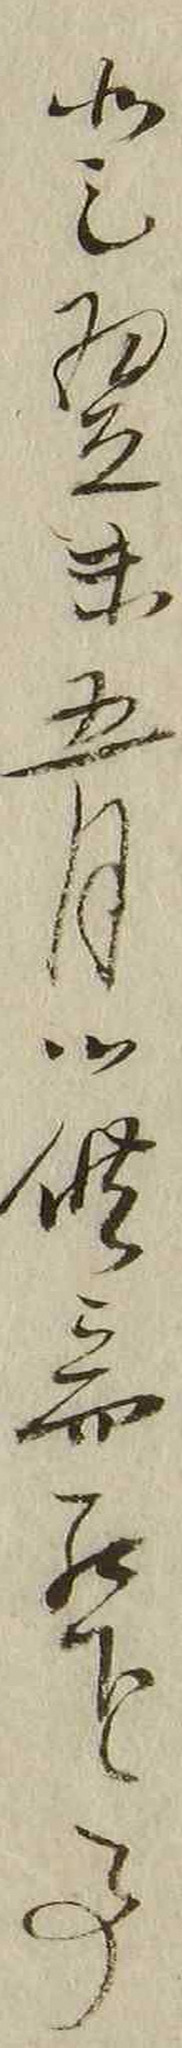登翌未五月御供ニ而罷下候事
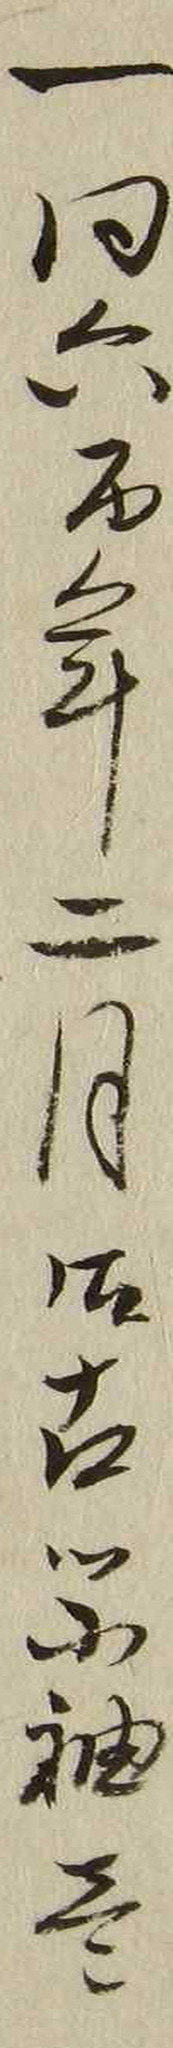一同六酉年二月御古御小袖壱
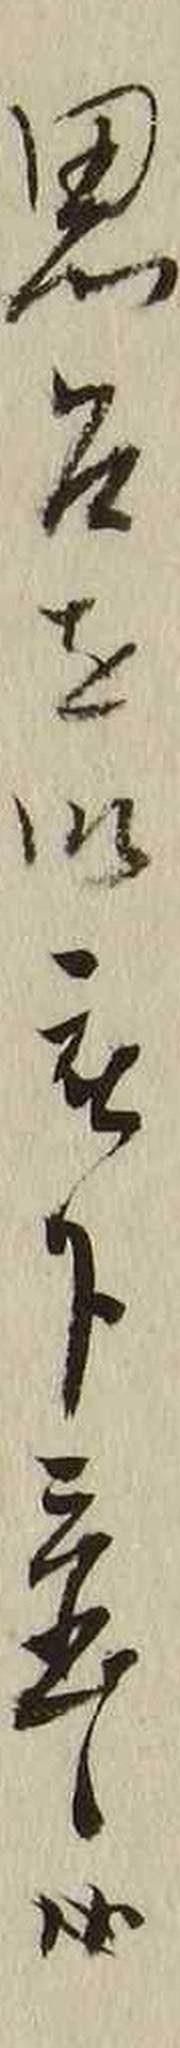思召を以被下置候
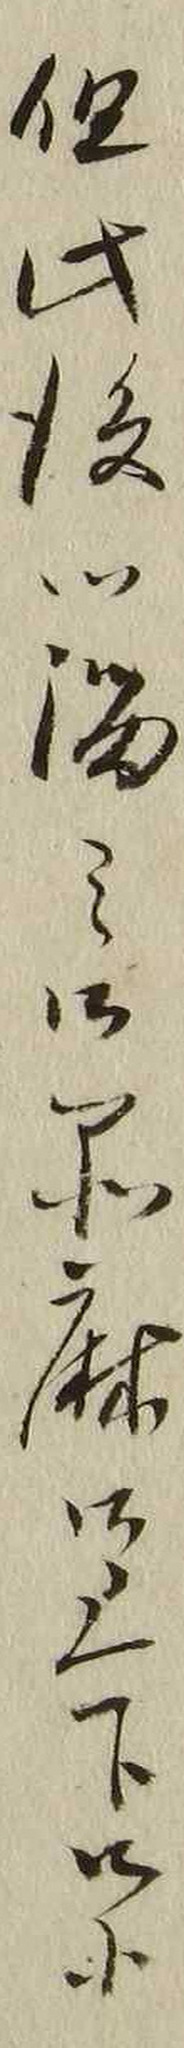但此後御溜之御品麻御上下御小
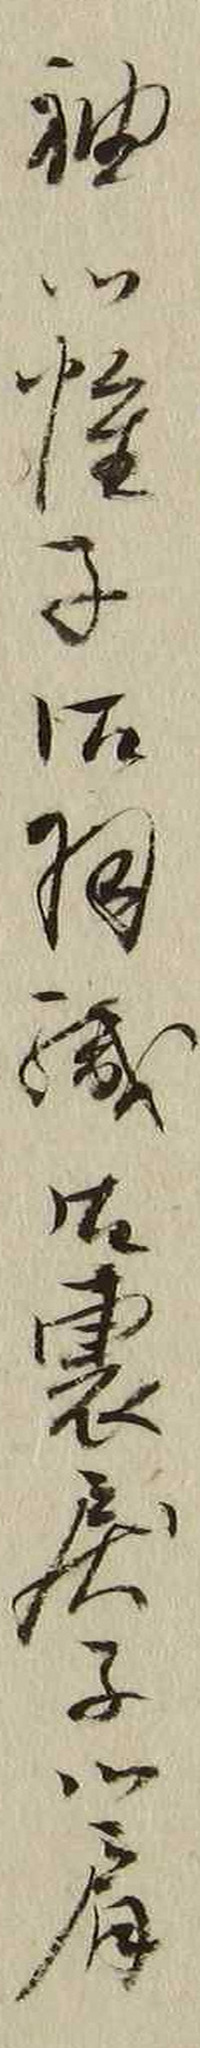袖御帷子御羽織御裏戻子御肩
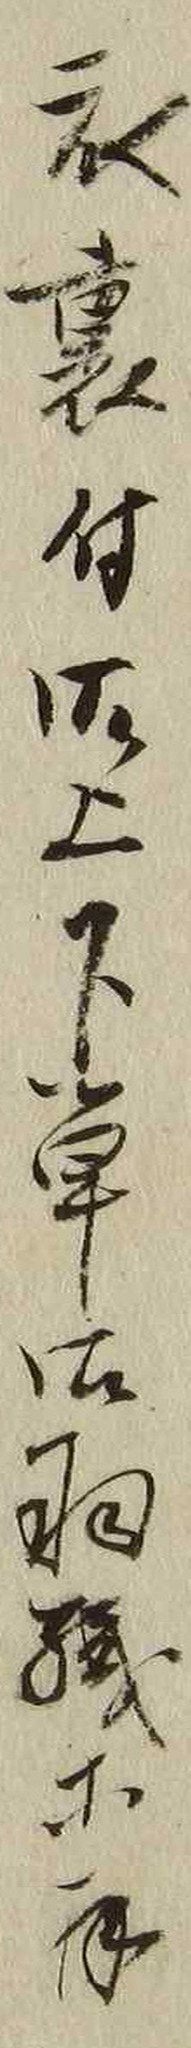衣裏付御上下単御羽織等拝
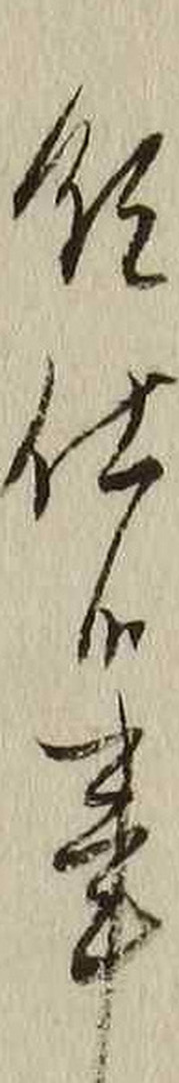領仕候事
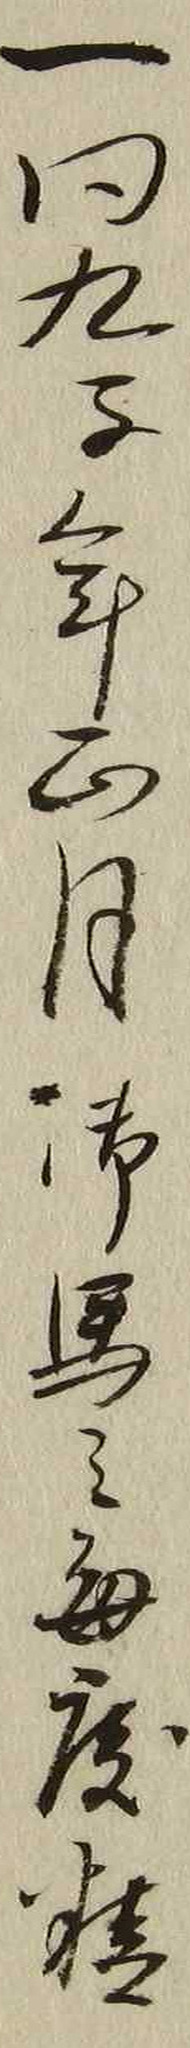一同九子年正月御馬之毎度精
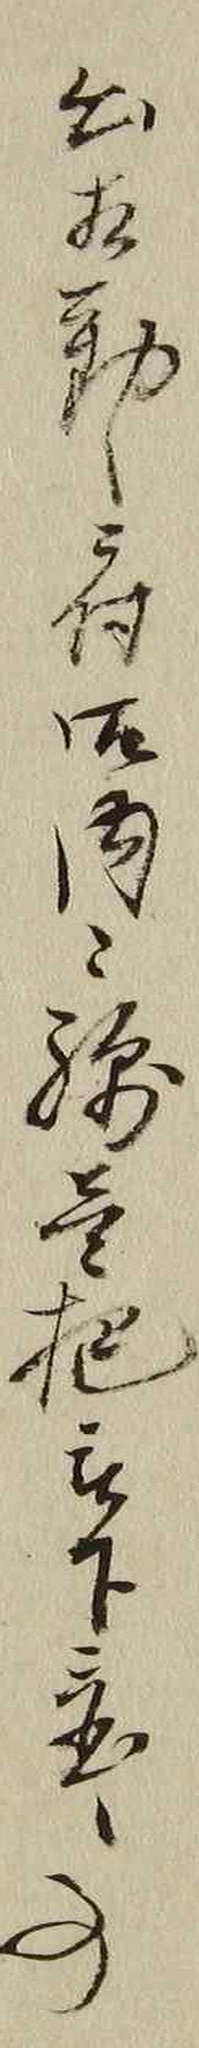出相勤候ニ付御内々綿壱把被下置候事
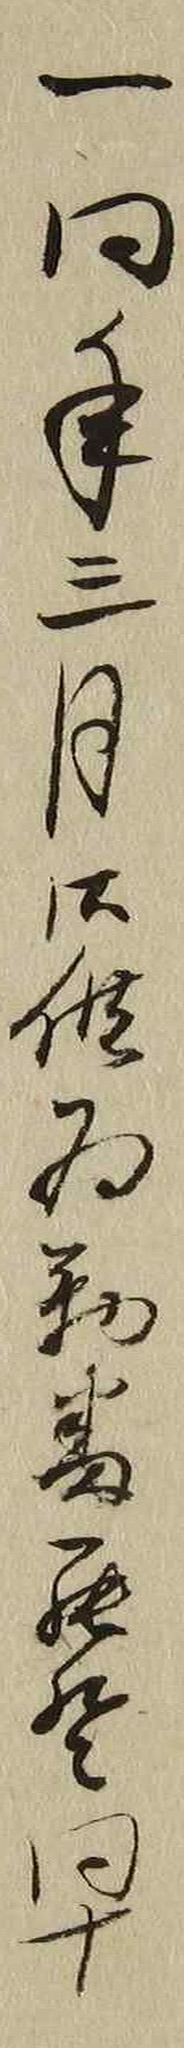一同年三月御供為勤番罷登同十
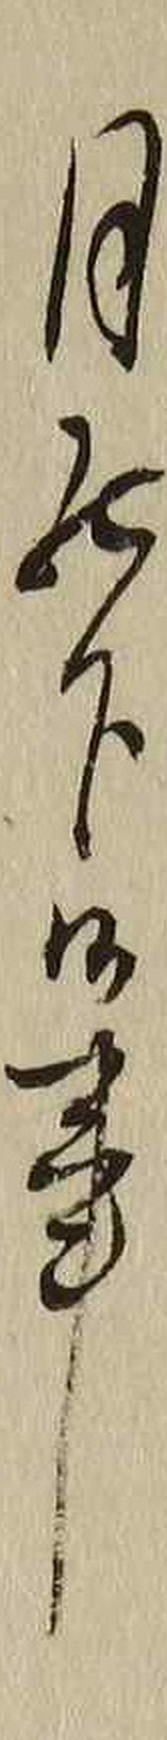月罷下候事
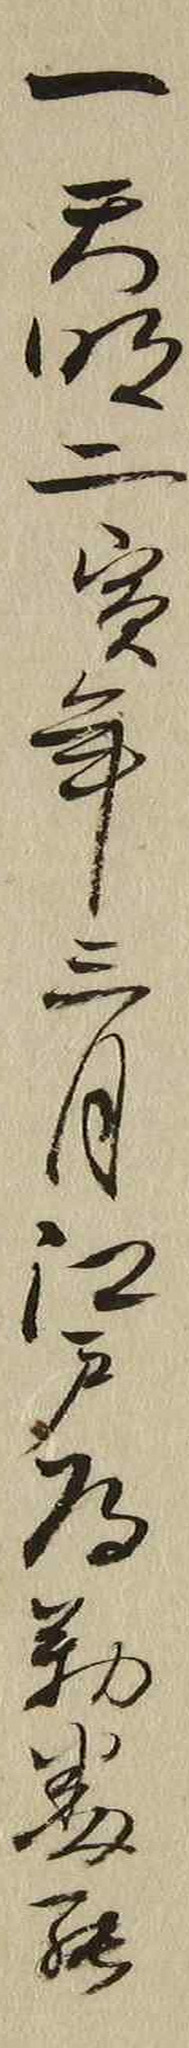一天明二寅年三月江戸為勤番罷
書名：諸士系譜　巻之359　す之部9
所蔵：会津若松市立会津図書館
